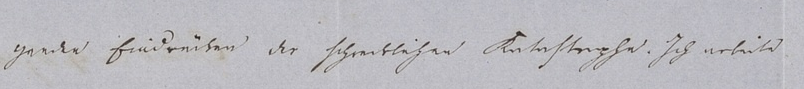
genden eindrücken der schrecklichen Katastrophe. Ich arbeite
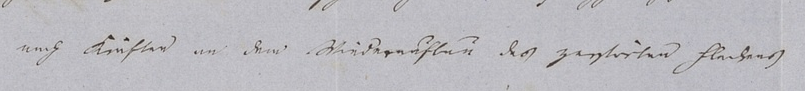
nach Kräften an dem Wiederaufbau des zerstörten Fleckens
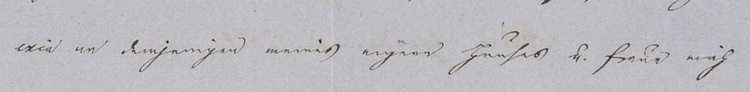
wie an demjenigen meines eignen Hauses u. freue mich
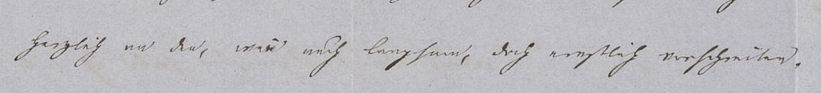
herzlich an den, wenn auch langsam, doch ernstlich vorschreiten-
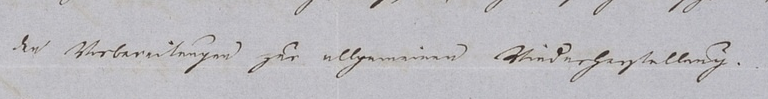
den Vorbereitungen zur allgemeinen Wiederherstellung.
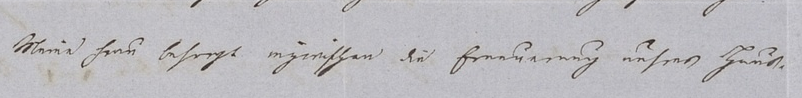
Meine Frau besorgt inzwischen die Erneuerung unsres Haus-
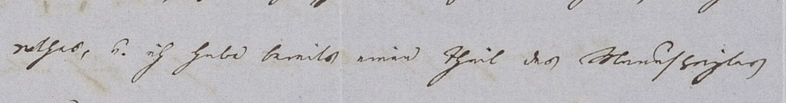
rathes, u. ich habe bereits einen Theil des Manuskriptes
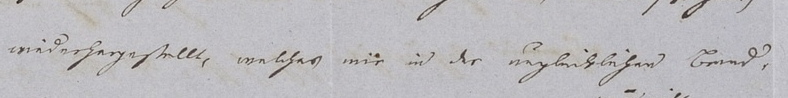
wiederhergestellt, welches mir in der unglücklichen Brand-
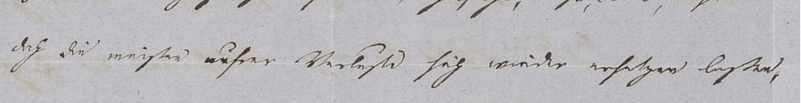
doch die meisten unsrer Verluste sich wieder ersetzen lassen,
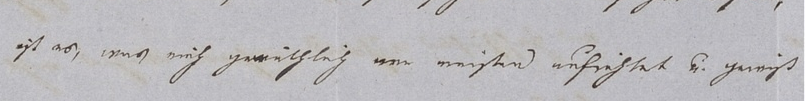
ist es, was mich gemüthlich am meisten aufrichtet u. gewiß
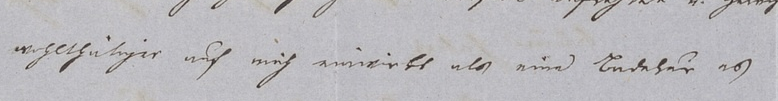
wohlthätiger auf mich einwirkt als eine Badekur es
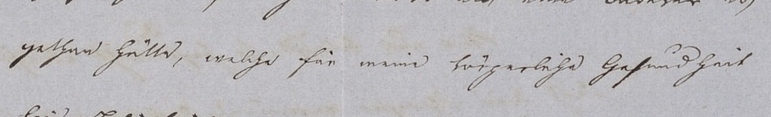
gethan hätte, welche für meine körperliche Gesundheit
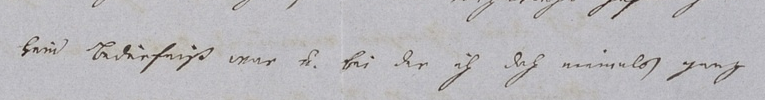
kein Bedürfniß war u. bei der ich doch niemals ganz
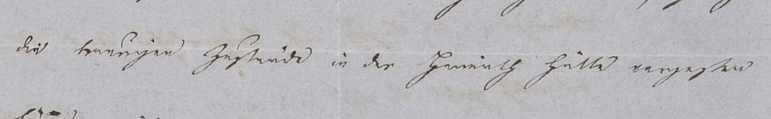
die traurigen Zustände in der Heimath hätte vergessen
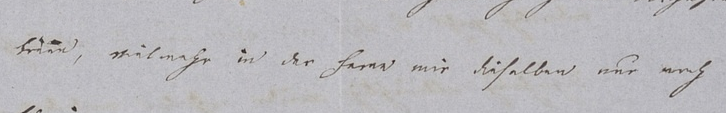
können, vielmehr in der Ferne mir dieselben nur noch
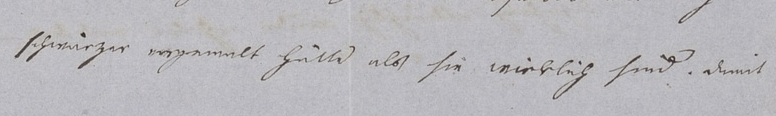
schwärzer vorgemalt hätte als sie wirklich sind. Damit
